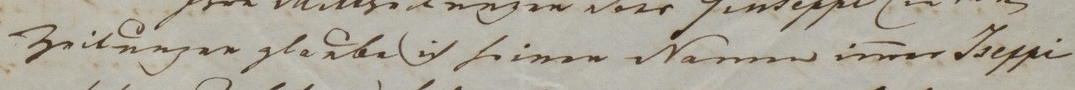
Zeitungen glaube ich seinen Namen immer Iseppi
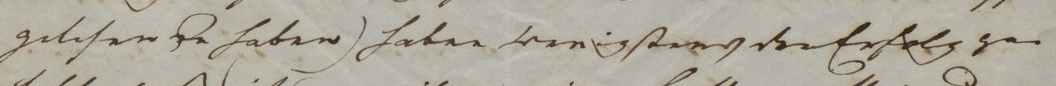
gelesen zu haben) haben wenigstens den Erfolg ge-
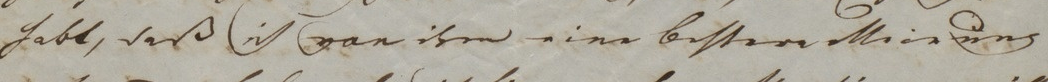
habt, daß ich von ihm eine bessere Meinung
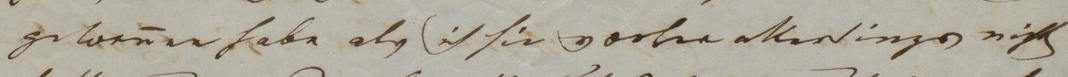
gewonnen habe als ich sie vorher allerdings nicht
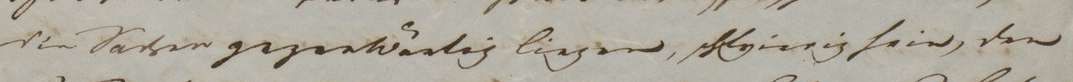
die Sachen gegenwärtig liegen, schwierig sein, den
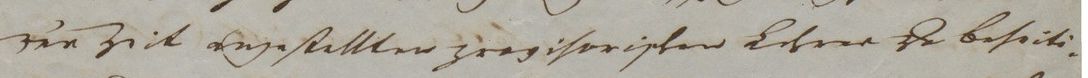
zur Zeit angestellten provisorischen Lehrer zu beseiti-
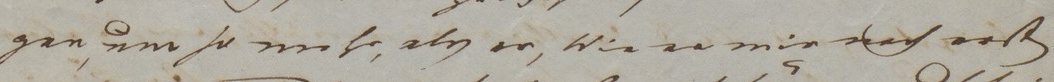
gen, um so mehr, als er, wie er mir noch erst
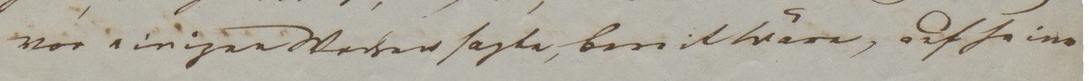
vor einigen Wochen sagte, bereit wäre, auf seine
